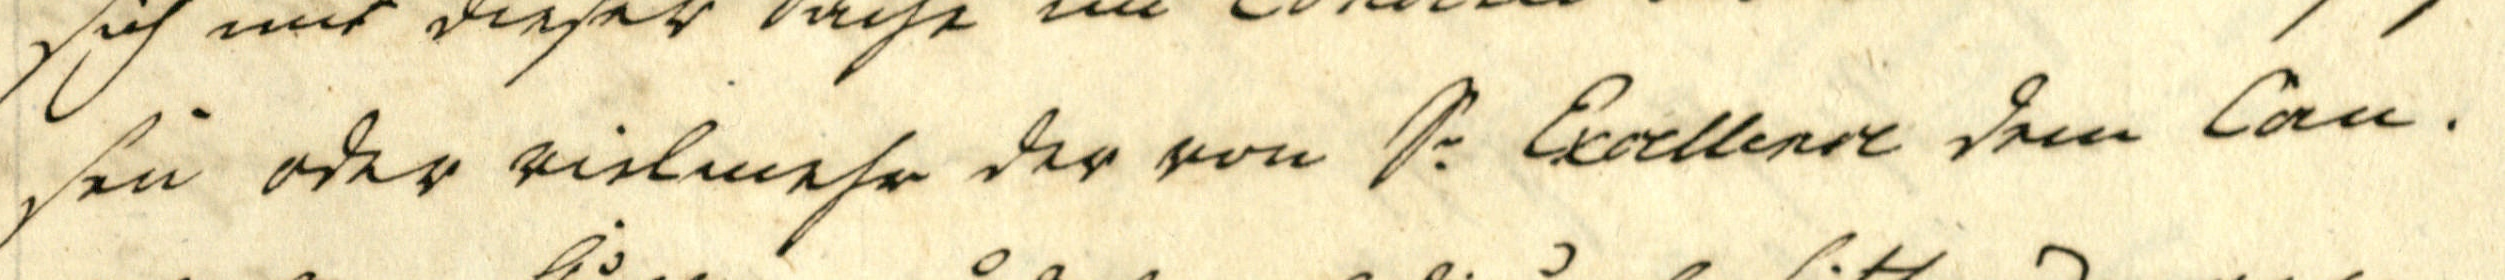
sen der vielmehr der von Sr. Excellence dem Can¬
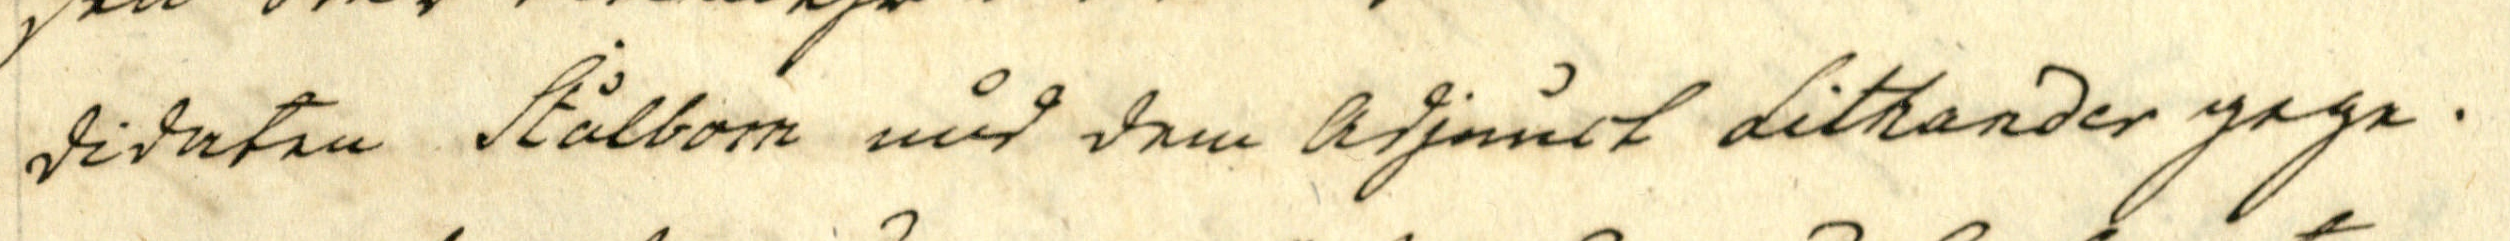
didaten Stålbom und dem Adjunct Lithander gege¬
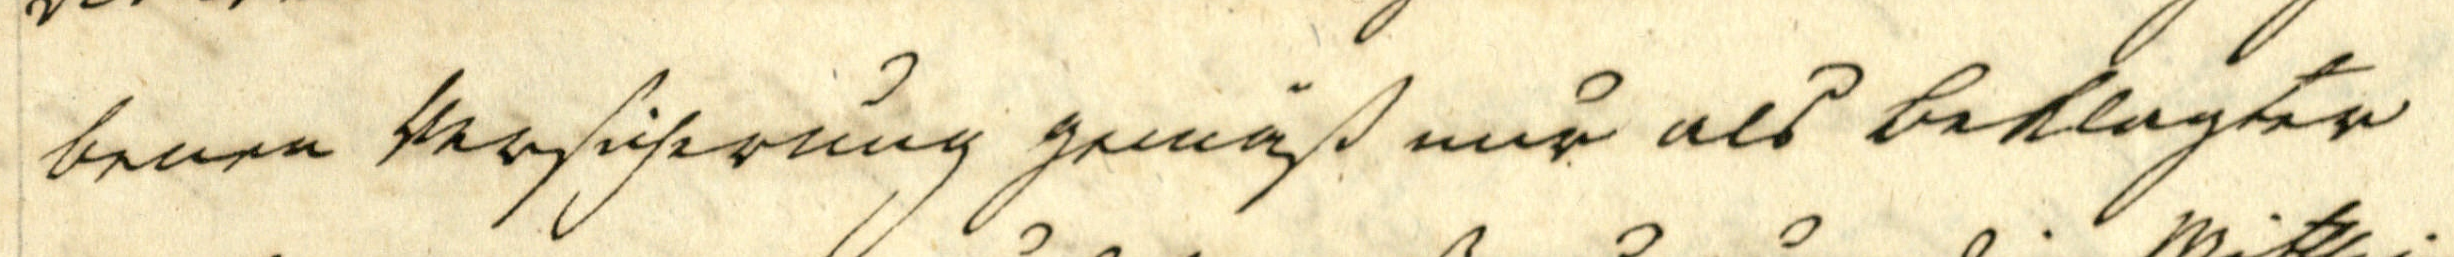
benen Versicherung gemäß nur als Beklagter
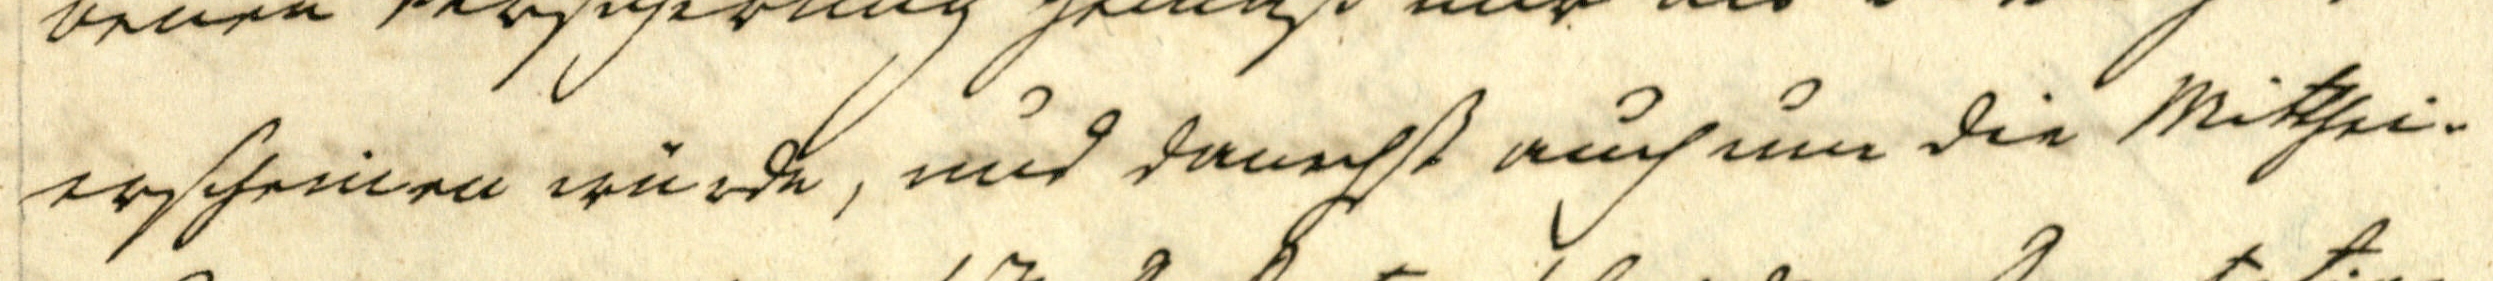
erscheinen würde, und danechst auch um die Mitthei¬
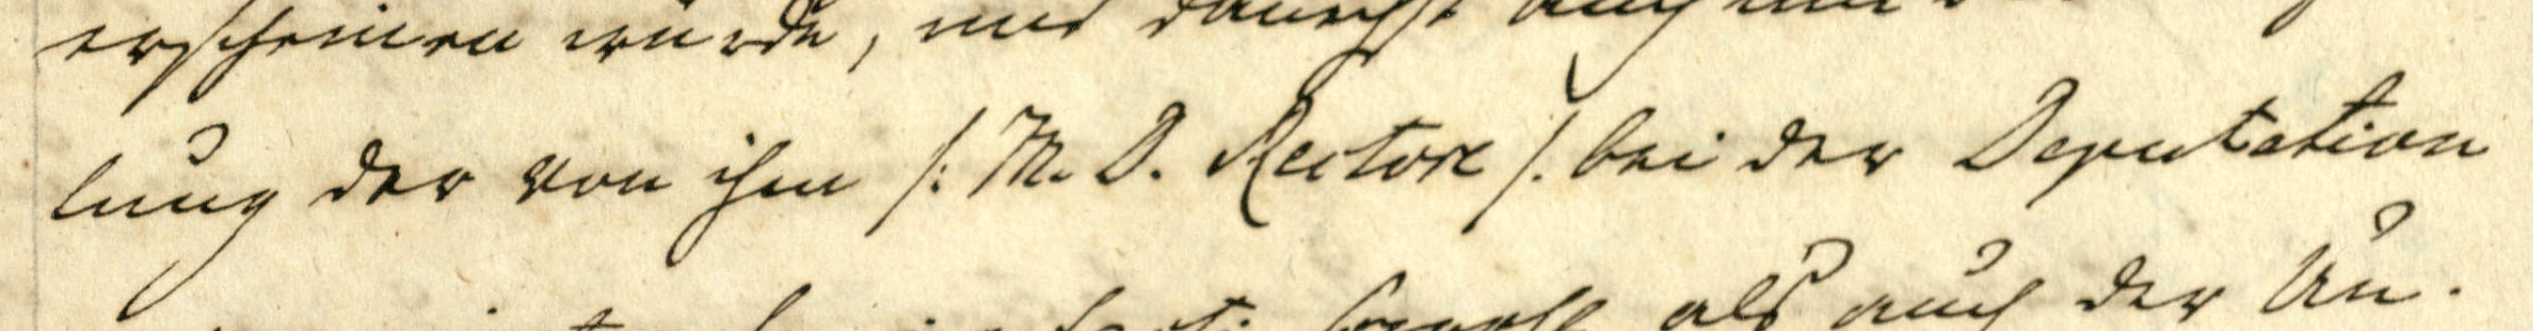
lung der von ihm /:. M. D. Rectore /bei der Deputation
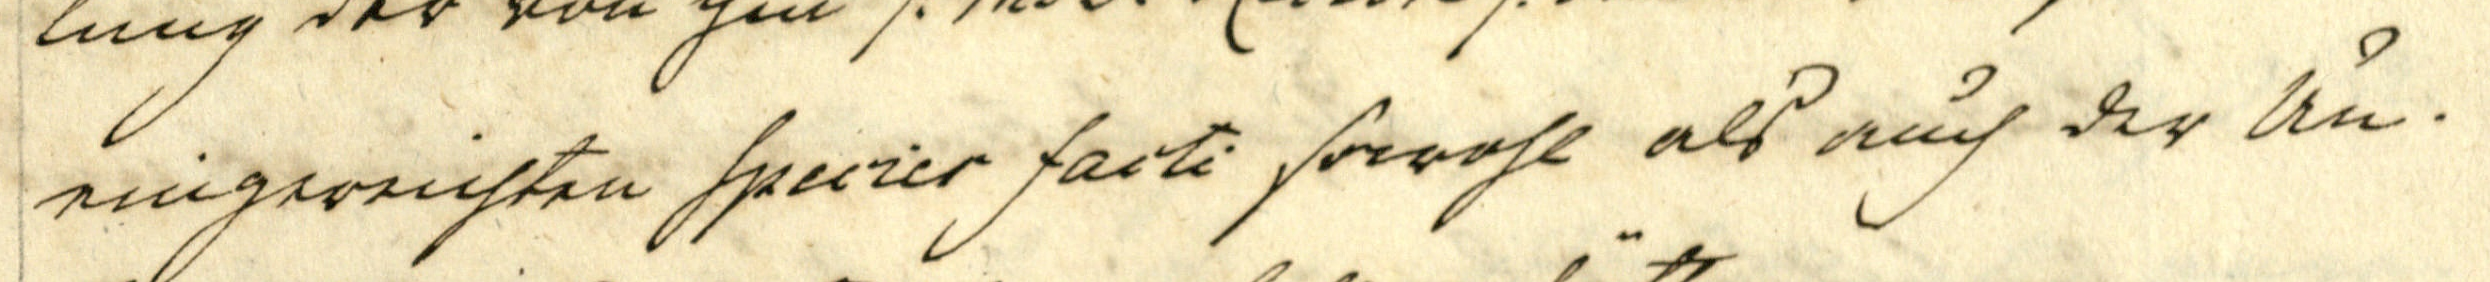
eingereichten species facti sowohl als auch der Un¬
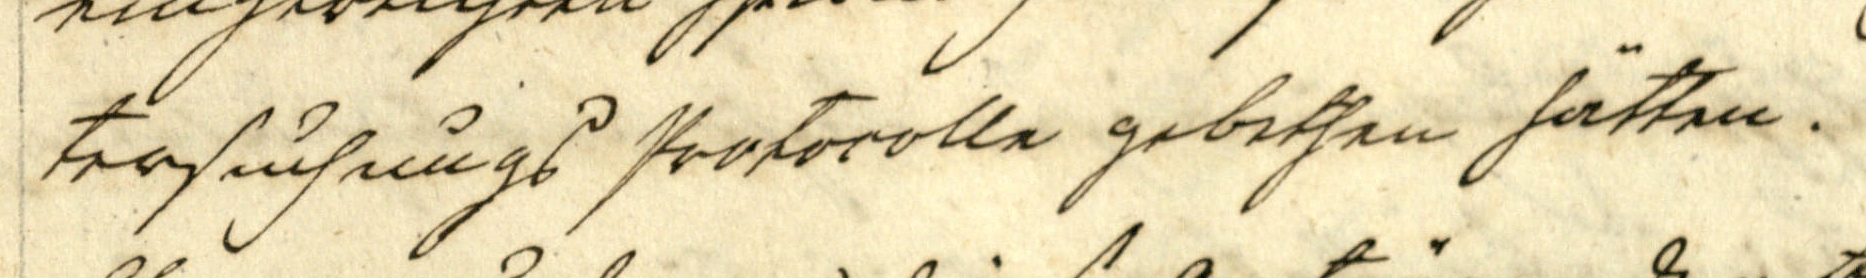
tersuchungs Protocolle gebethen hätten.
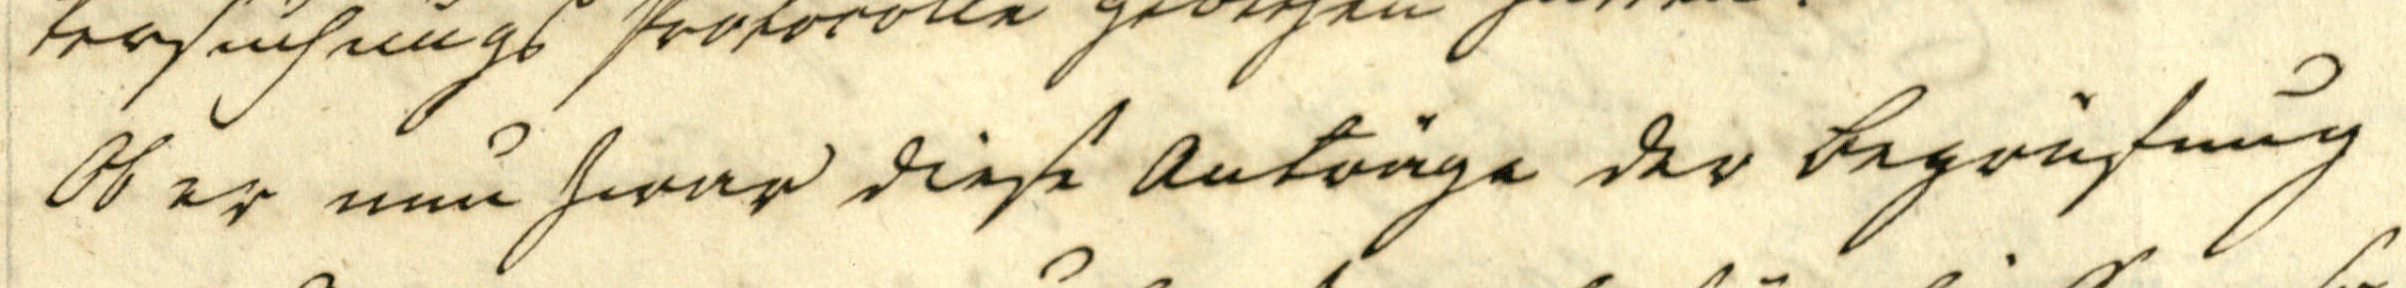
Ob er nun zwar diese Anträge der Beprüfung
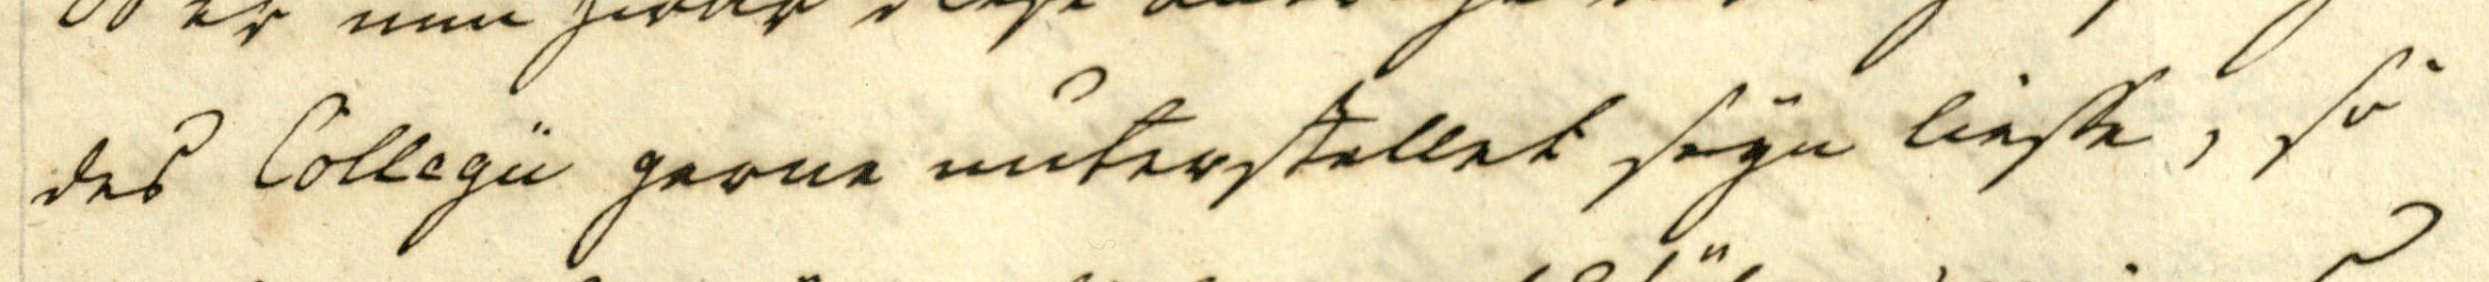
des Collegii gerne unterstellet seÿn liesse, so
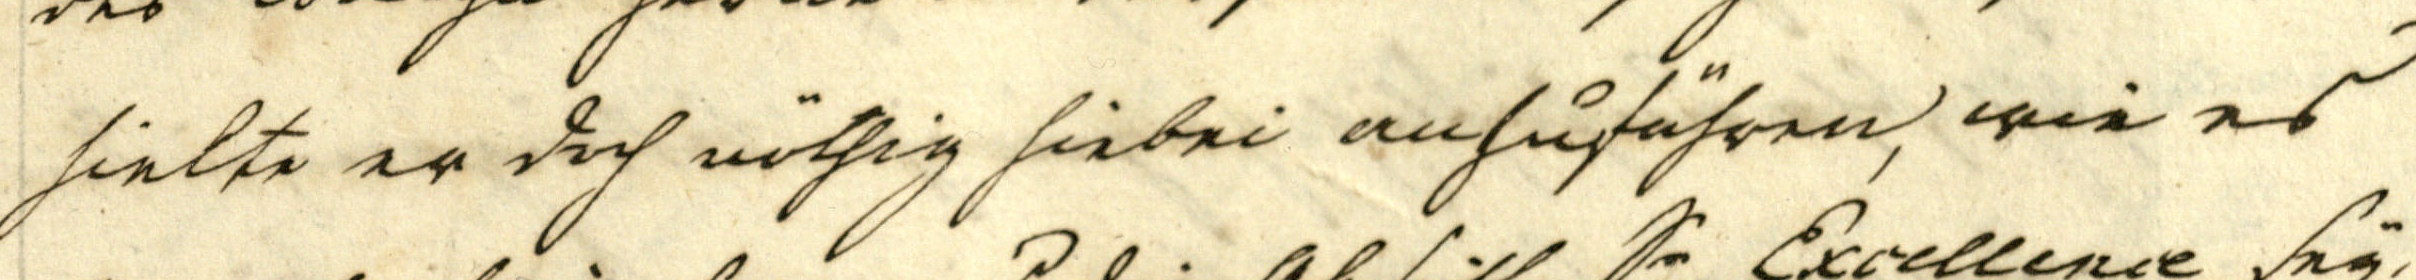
hielte er doch nöthig hiebei anzuführen, wie es
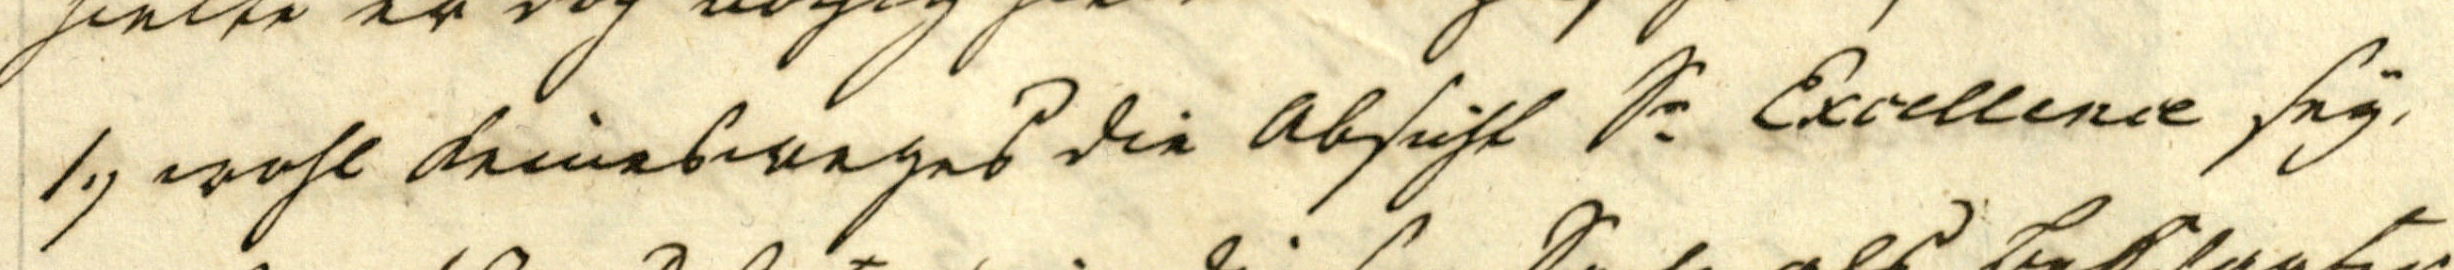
1., wohl keinesweges die Absicht Sr Excellence seÿ,
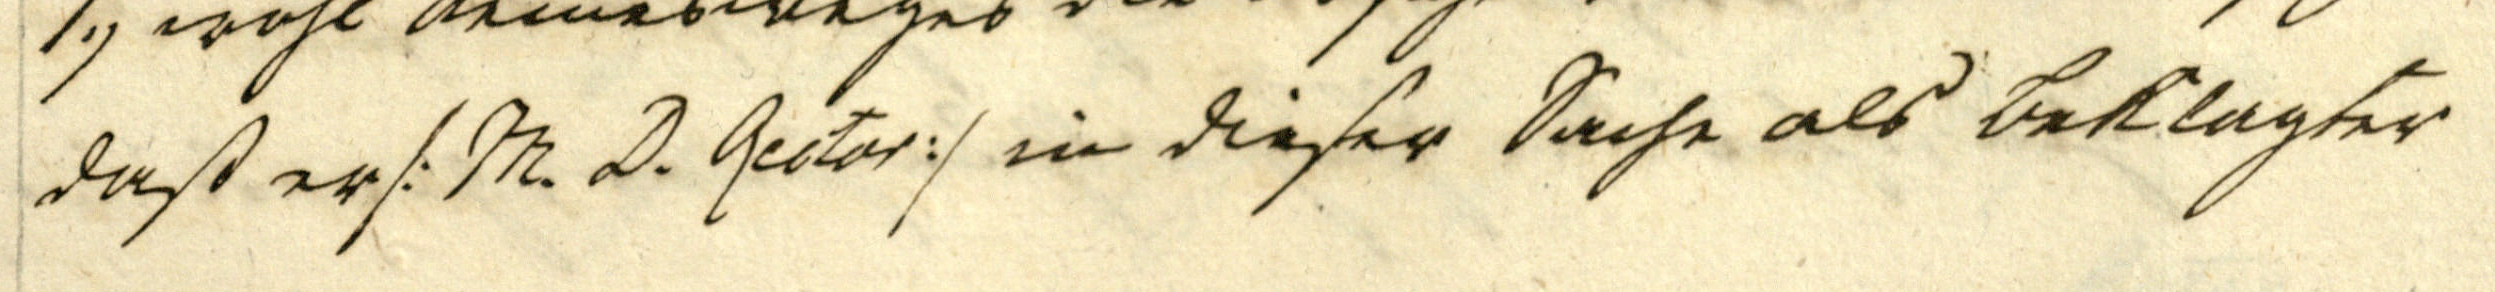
daß er /:M. D. Rector:/ in dieser Sache als Beklagter
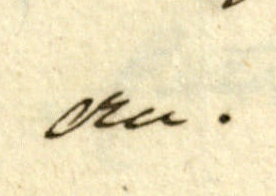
an.
